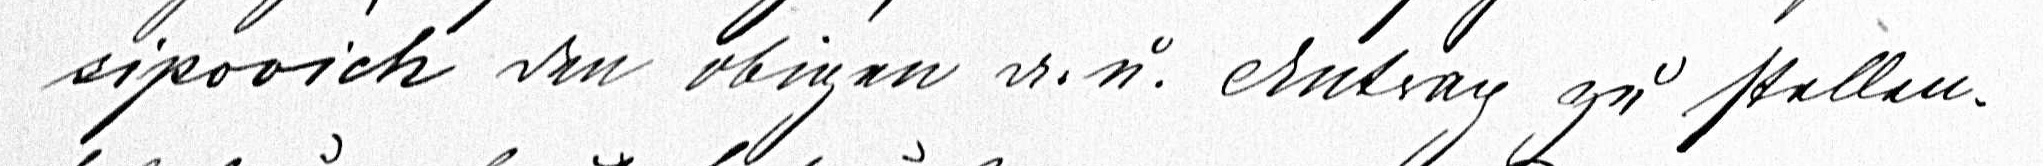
sipovich den obigen a.u. Antrag zu stellen.
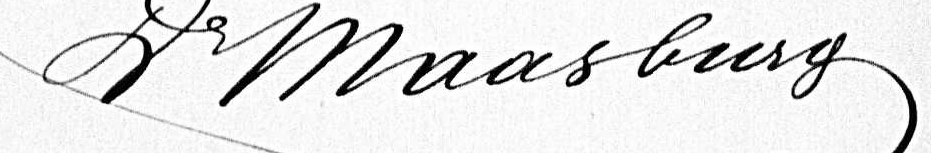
Dr. Maasburg
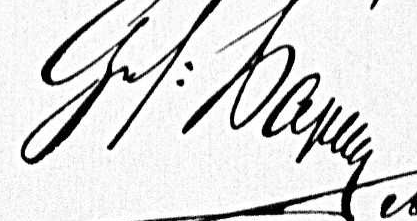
Ges. Papay
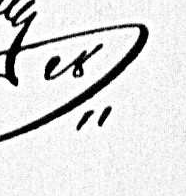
28/11
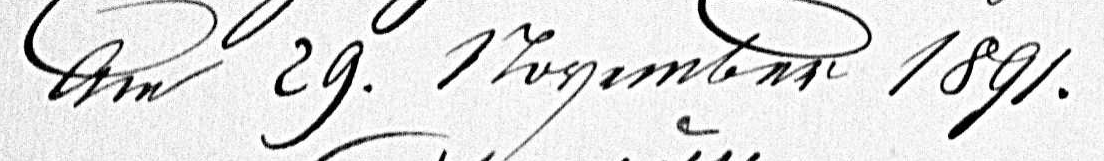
Am 29. November 1891
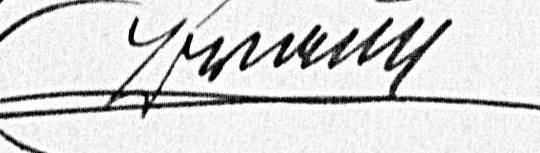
Braun
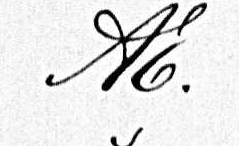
AE
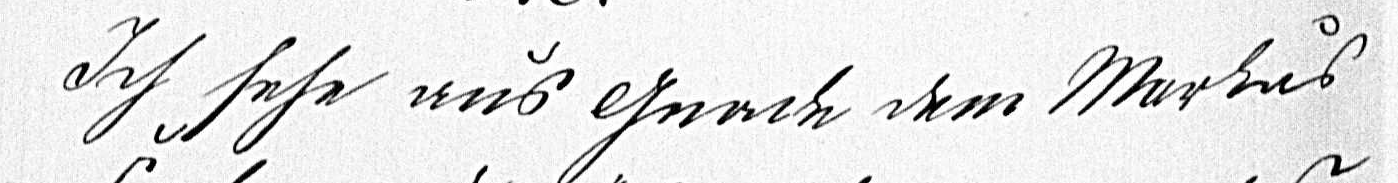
Ich sehe aus Gnade dem Markus
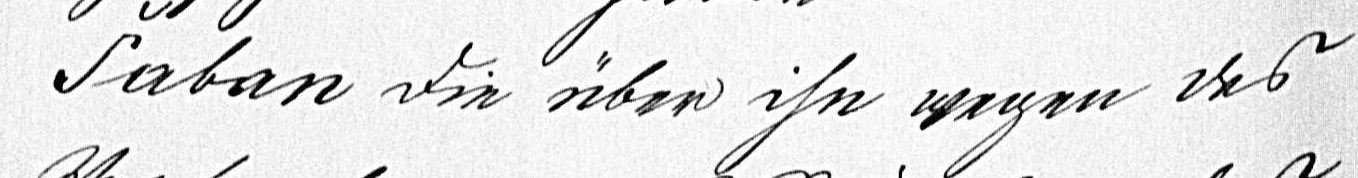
Šaban die über ihn wegen des
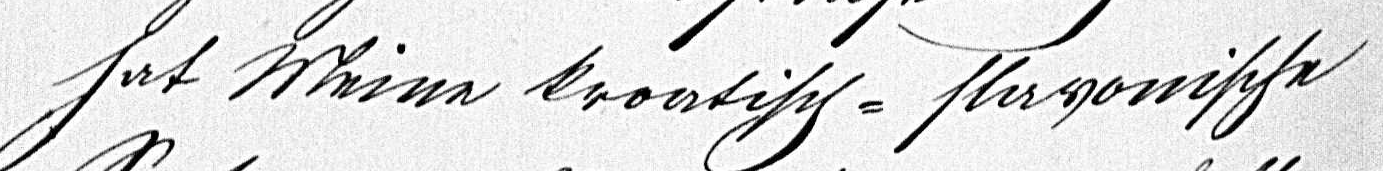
hat Meine kroatisch-slavonische
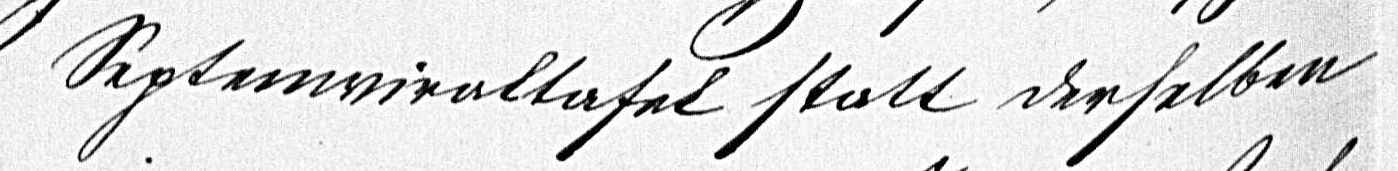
Septemviraltafel statt derselben
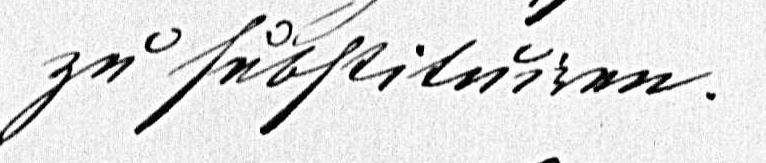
zu substituiren.
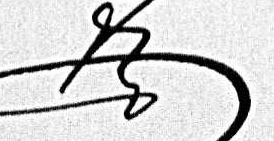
FJ
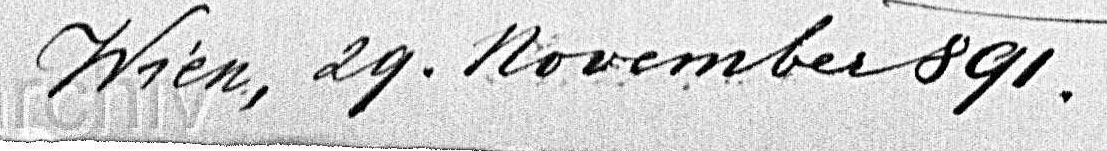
Wien, 29. November 1891
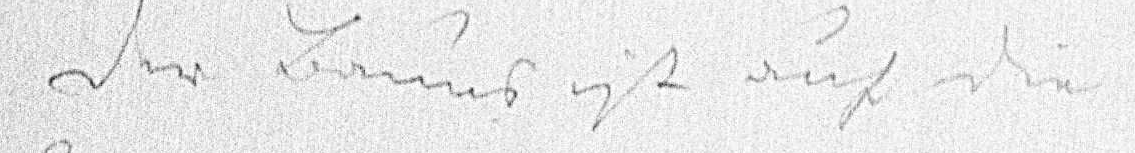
[in pencil, i’m guessing in FJ’s own hand: „Der Banus ist auf
